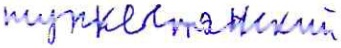тупкестянский
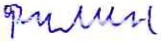филин
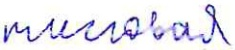тиссовая
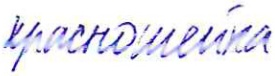красношейка
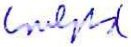стерх
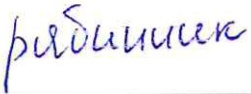рябинник
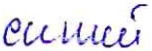синий
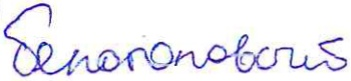белоголовый
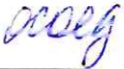осоед
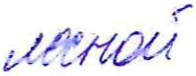лесной
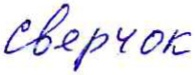сверчок
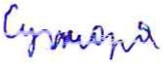суторя
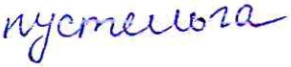пустельга
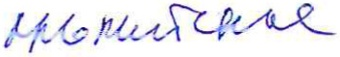альпийская
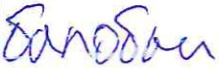балобан
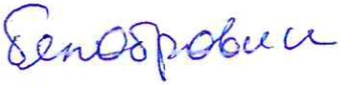белобровик
